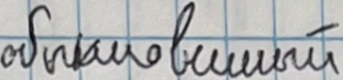обыкновенный
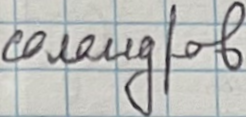соландров
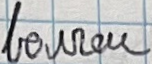волчок
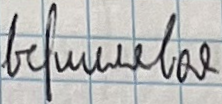вертлявая
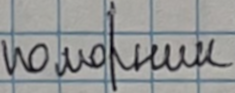поморник
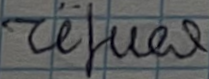чёрная
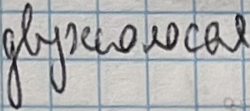двухполосая
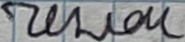чеглок
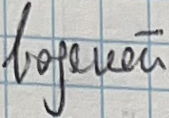водяной
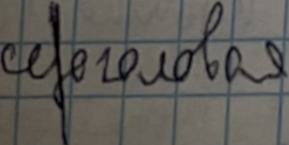сероголовая
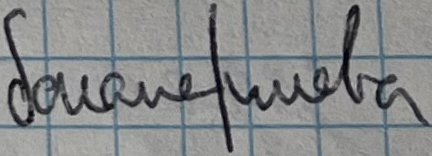бонапартова
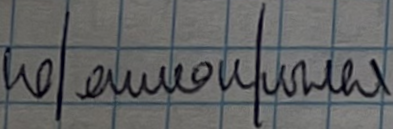короткокрылая
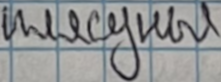плясунья
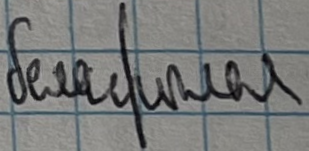белокрылая
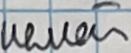немой
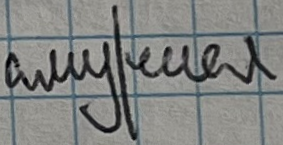амурская
